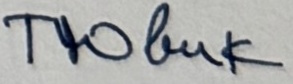тювик
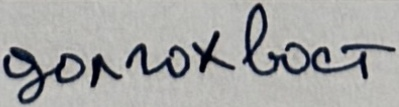долгохвост
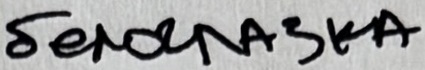белоглазка
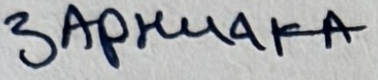зарничка
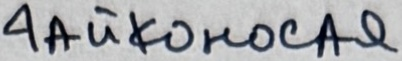чайконосая
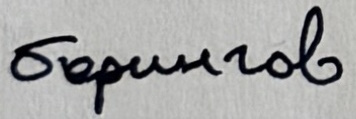берингов
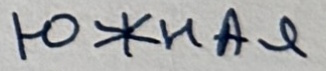южная
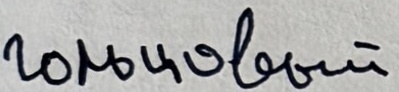гольцовый
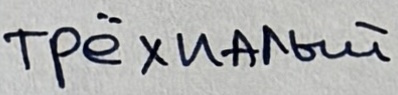трёхпалый
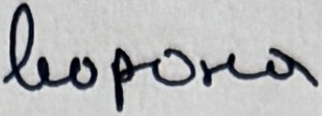ворона
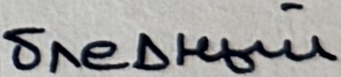бледный
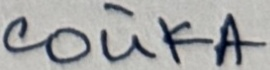сойка
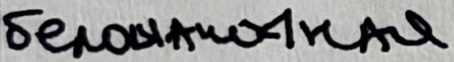белошапочная
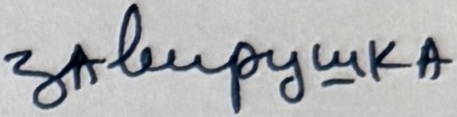завирушка
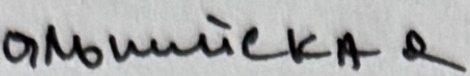альпийская
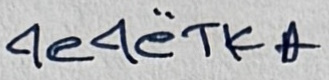чечётка
